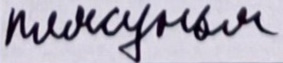плясунья
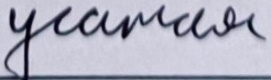усатая
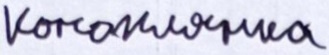коноплянка
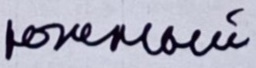южный
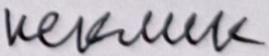кеклик
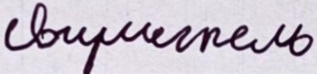свиристель
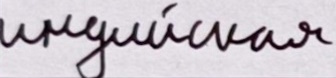индийская
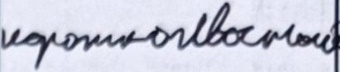короткохвостый
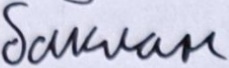баклан
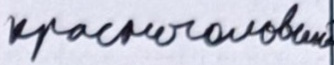красноголовшй
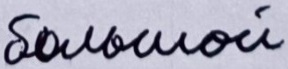большой
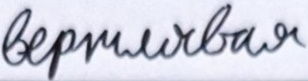вертлявая
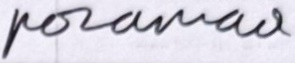рогатая
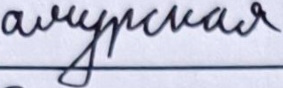амурская
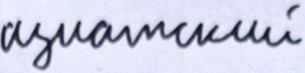азиатский
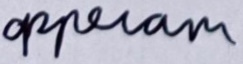фрегат
